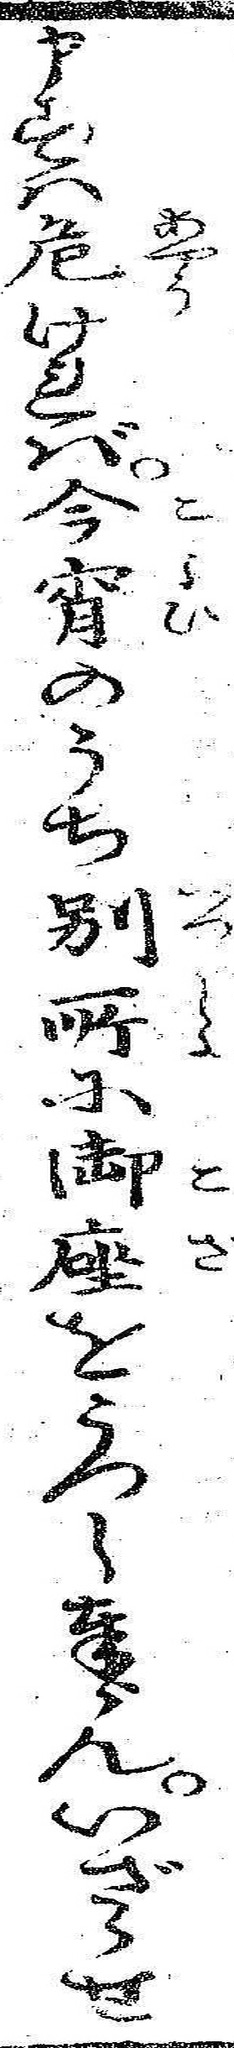申すは危ければ。今宵のうち別所に御座をうつし奉らん。いざゝせ
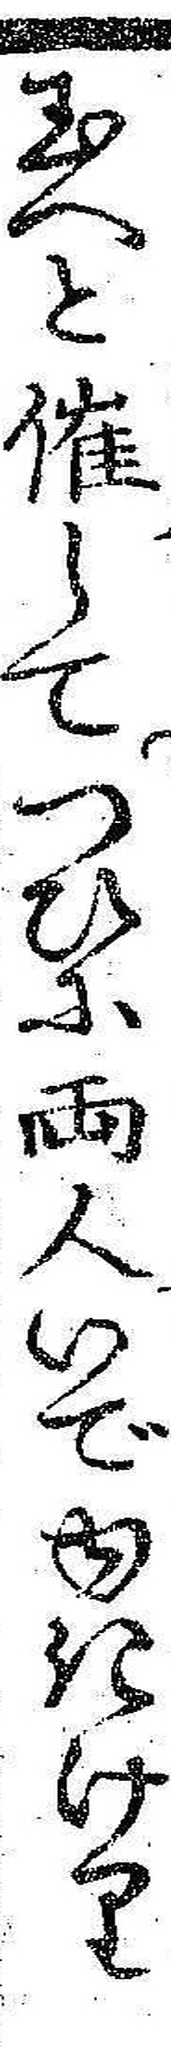玉へと催して。つひに両人いでゆきけり

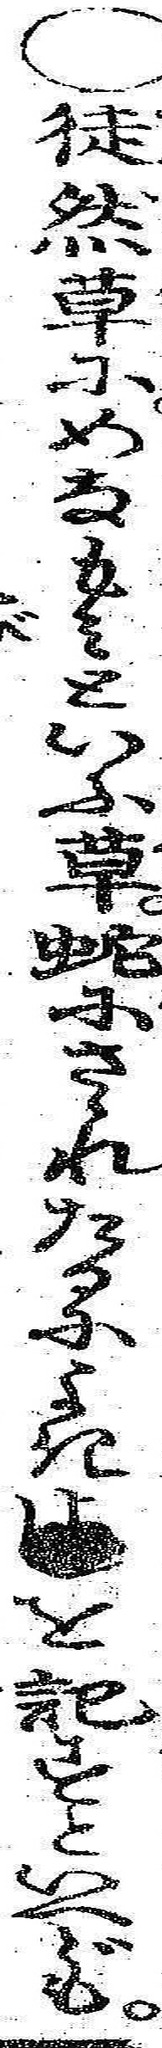○徒然草に。めなもみといふ草。蛇にさゝれたるによきよしを記すといへども。
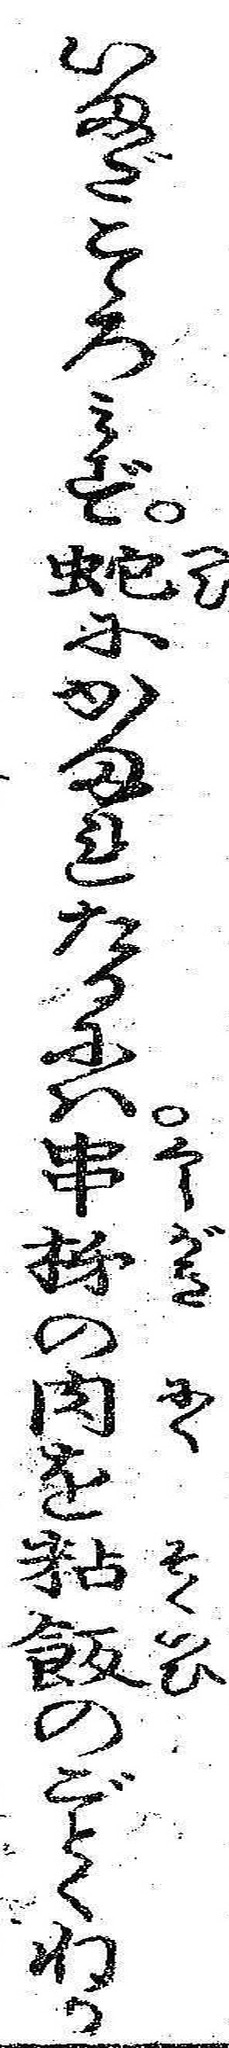いまだこゝろみず。蛇にかまれたるには。串柿の肉を粘飯のごとくねり
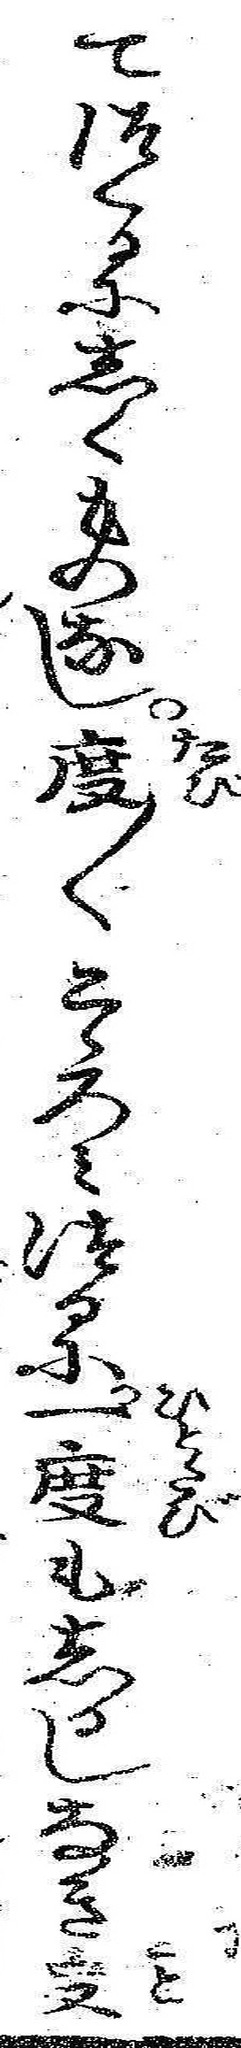てつくるにしくものなし。度〳〵こゝろみつるに。一度もしるしなき事
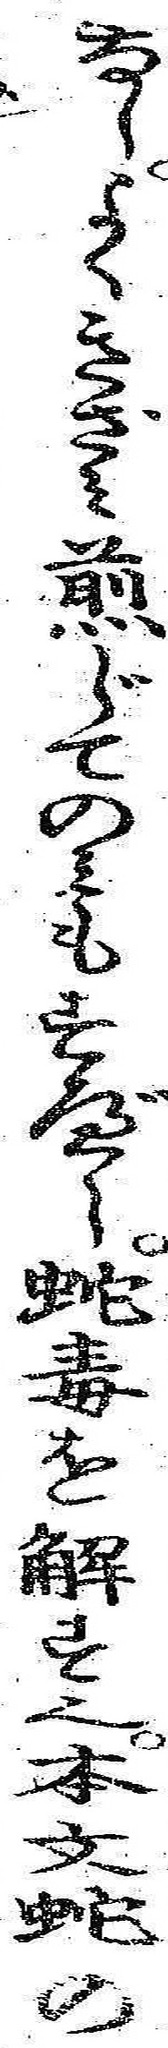なし。よくきざみ煎じてのみもすべし。蛇毒を解す也。本文蛇の
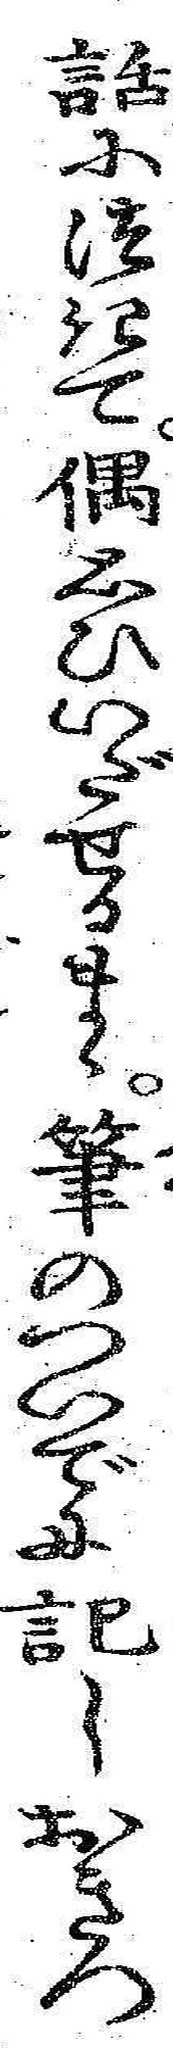話につきて。偶思ひいだせるまゝ。筆のついでに記しおきつ
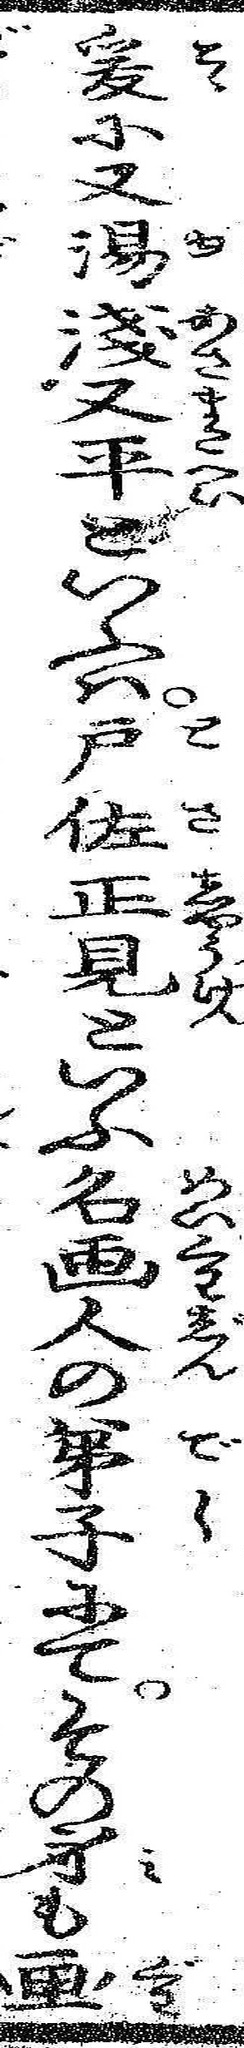爰に又湯浅又平といふは。戸佐正見といふ名画人の弟子にて。その身も画
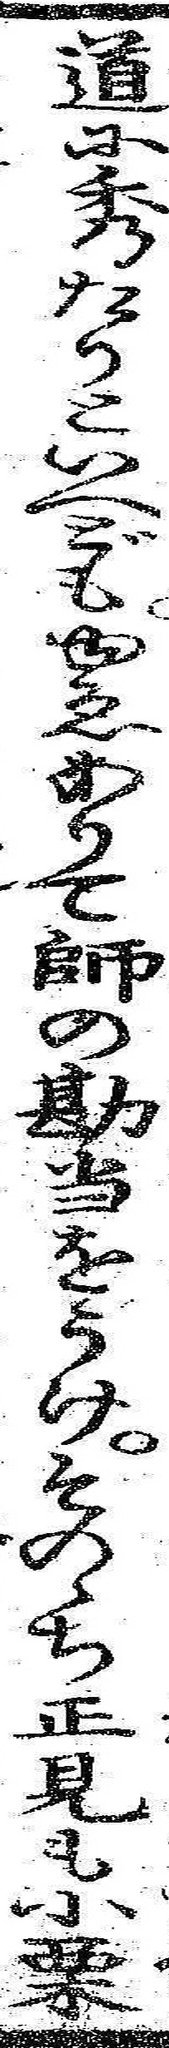道に秀たりといへども。ゆゑありて師の勘当をうけ。そのゝち正見も小粟
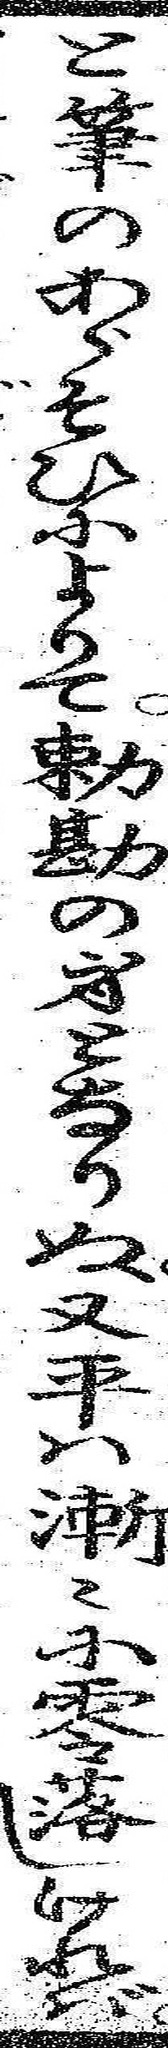と筆のあらそひによりて。勅勘の身となりぬ。又平は漸々に零落しければ。
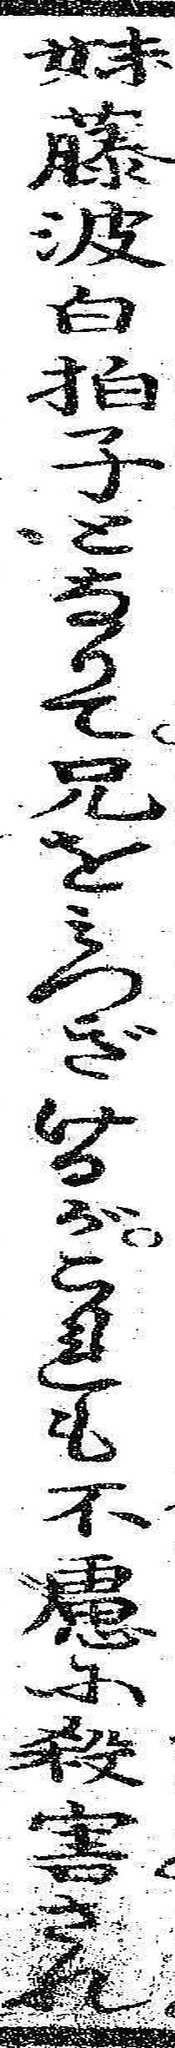妹藤波白拍子となりて。兄をみつぎけるが。これも不慮に殺害され。
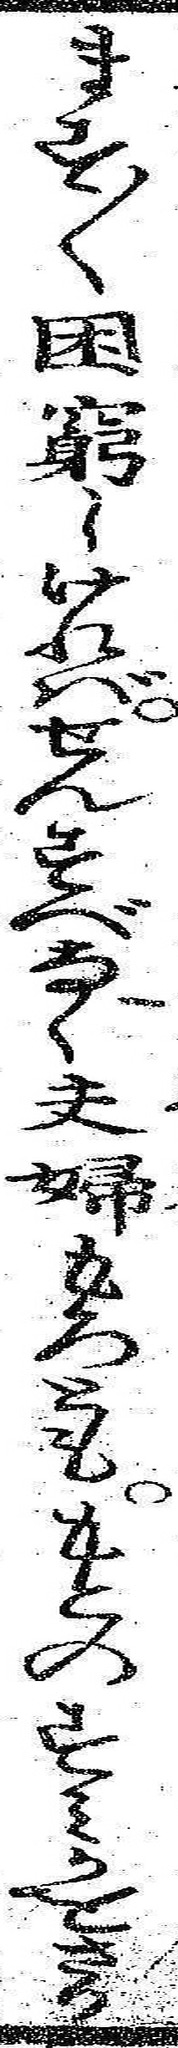ます〳〵困窮しければ。せんすべなく夫婦もろとも。もとのすみかをさり

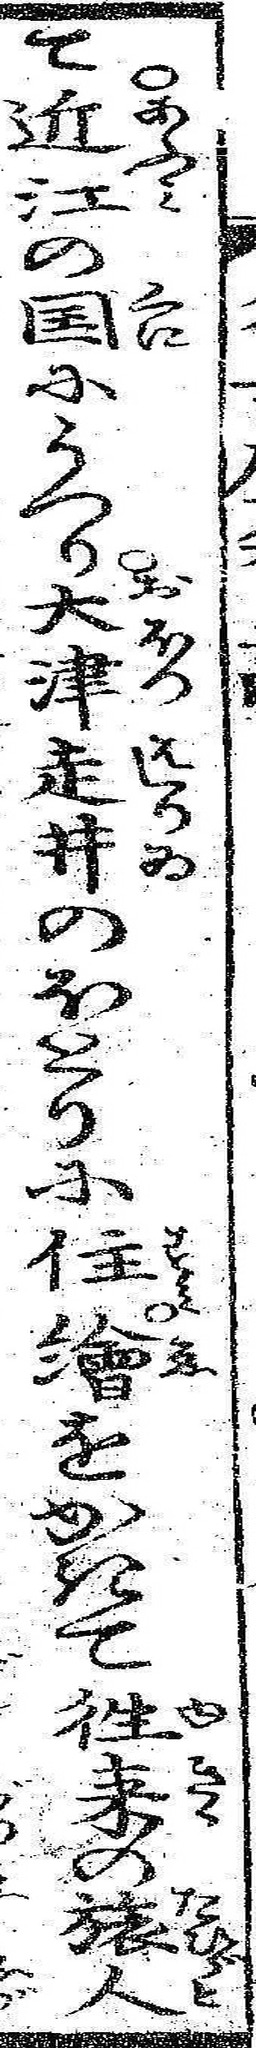て。近江の国にうつり。大津走井のほとりに住。絵をかきて往来の旅人
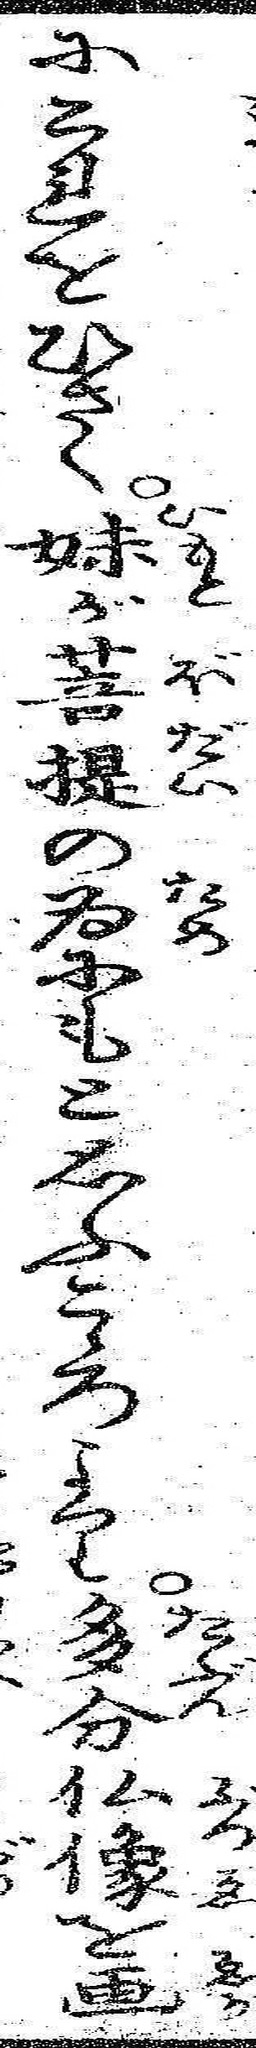にこれをひさく。妹が菩提の為にもと思ふこゝろより。多分仏像を画
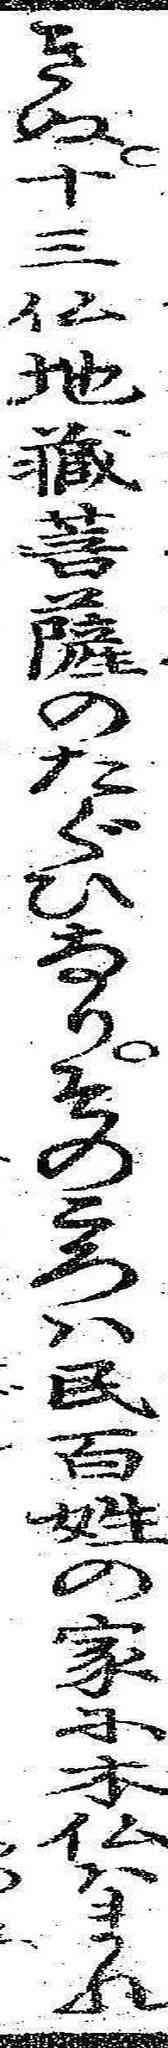きぬ。十三仏地蔵菩薩のたぐひなり。そのころは民百姓の家に木仏はまれ
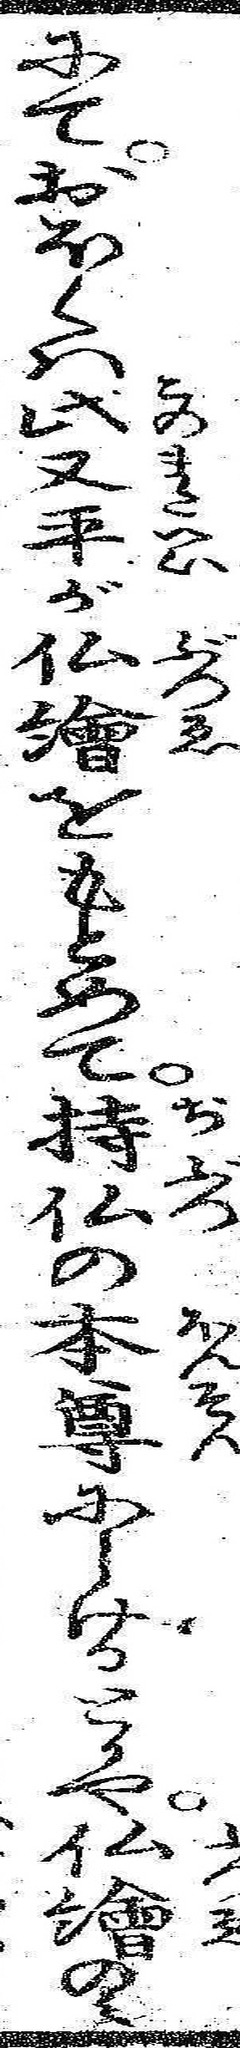にて。おほくは此又平が仏絵をもとめて。持仏の本尊にしけるとかや。仏絵のみ
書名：昔話稲妻表紙
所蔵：国文学研究資料館
